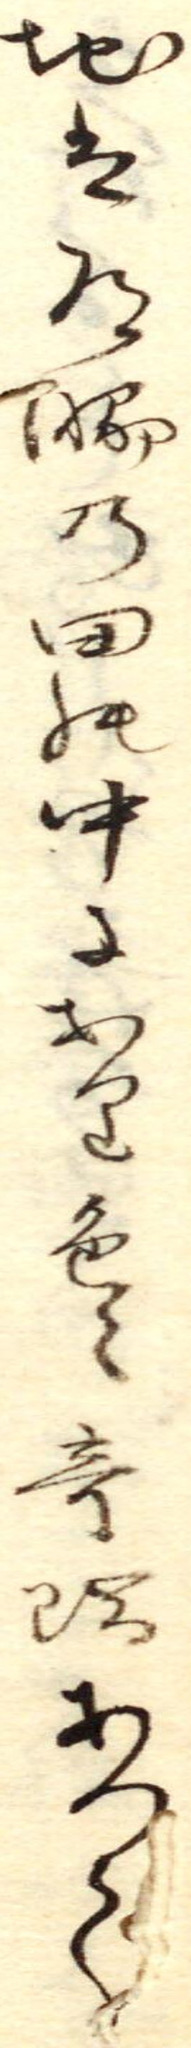地は道脇の田の中にあり色々奇瑞あつて
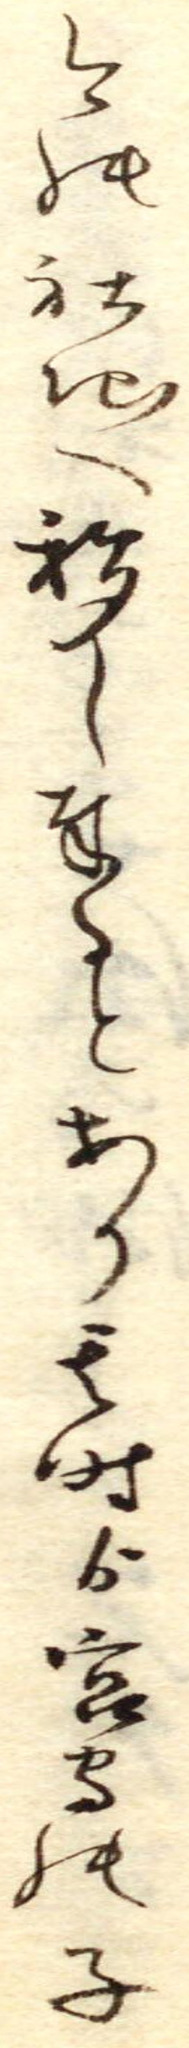今の社地へ移し奉るとあり其時ゟ宮寺の子
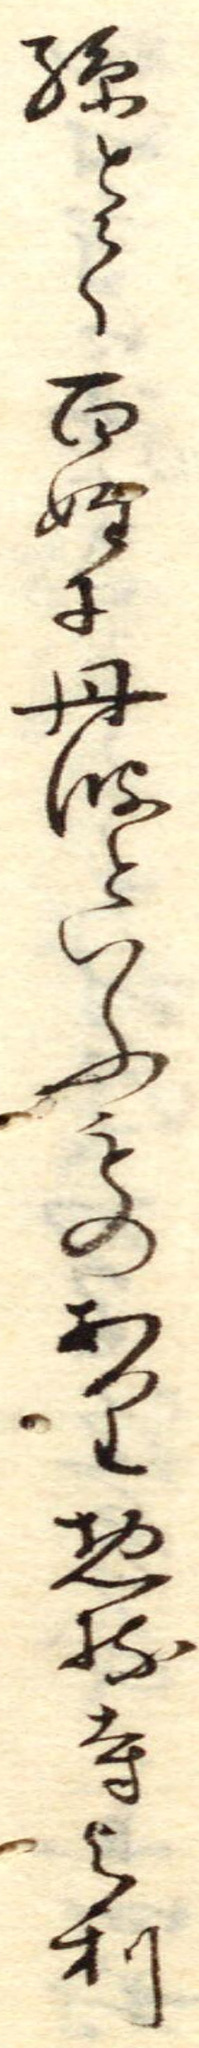孫とて百姓に丹波といふものあり惣持寺より
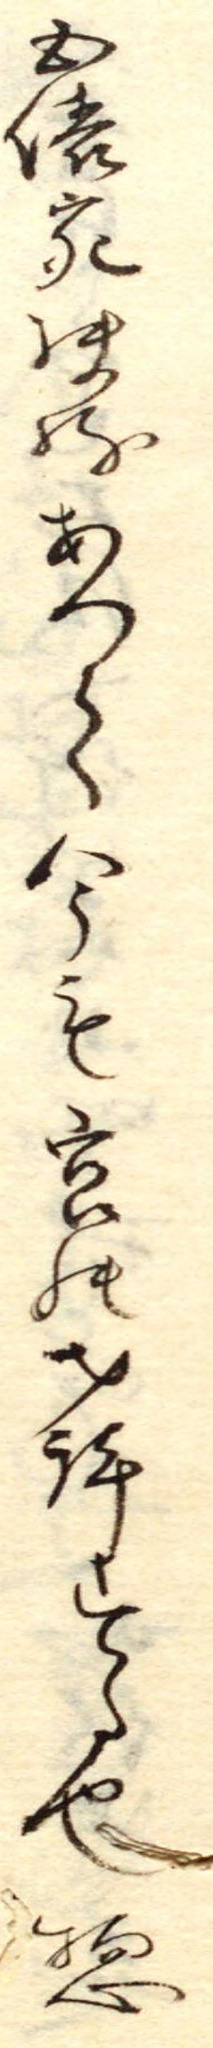五俵宛扶持あつて今も宮の才許する也総
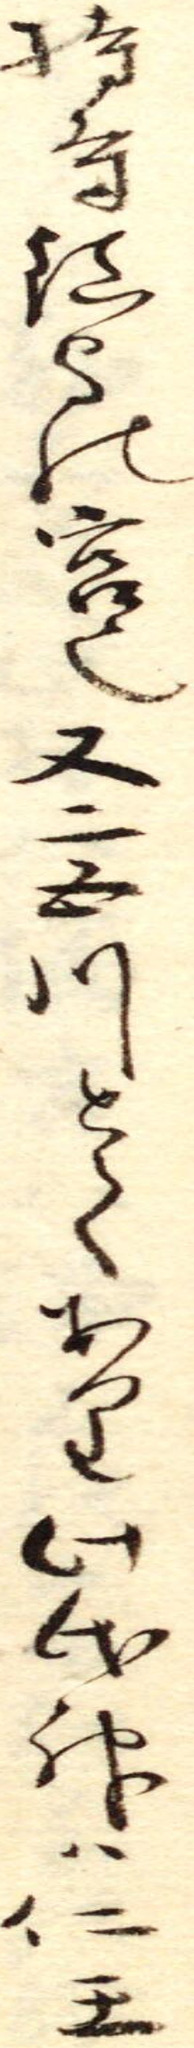持寺鎮守の宮也又宮川とてあり此氏神は仁王
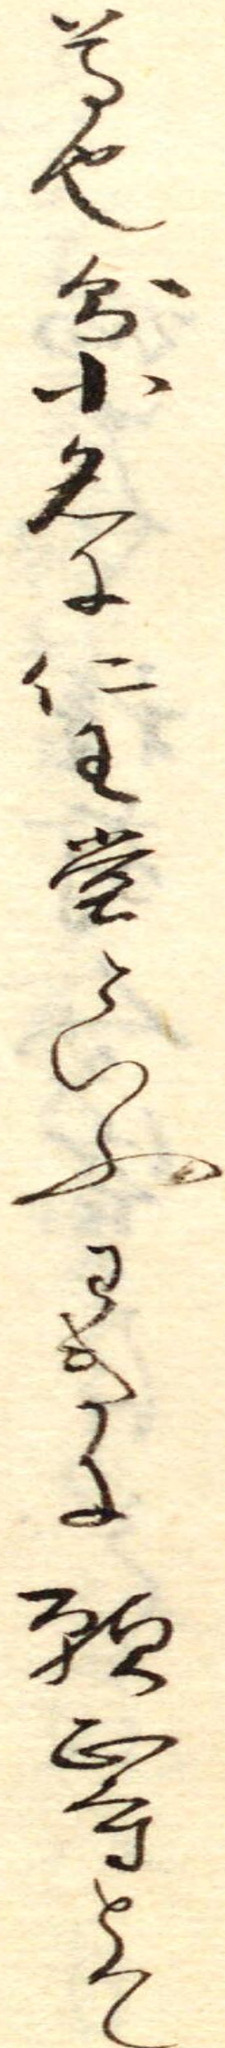尊也則小名に仁王堂といふわきに願正寺とて
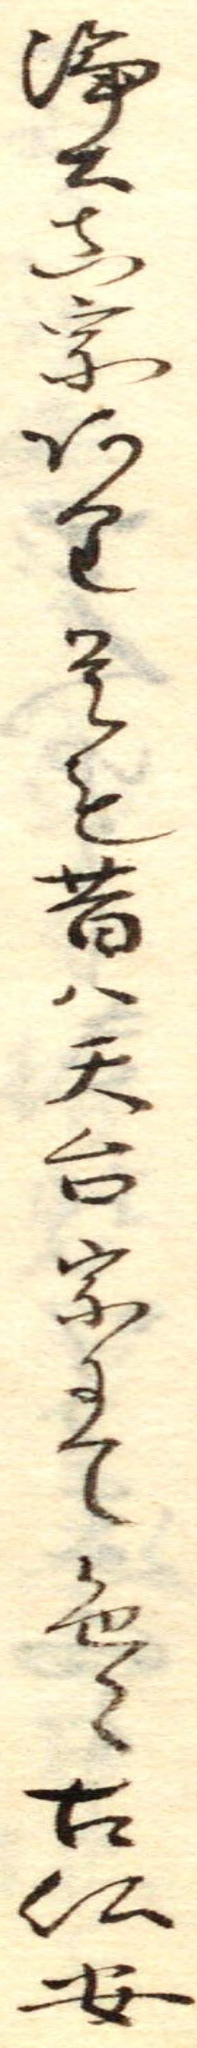浄土真宗あり是も昔は天台宗にて色々古仏安
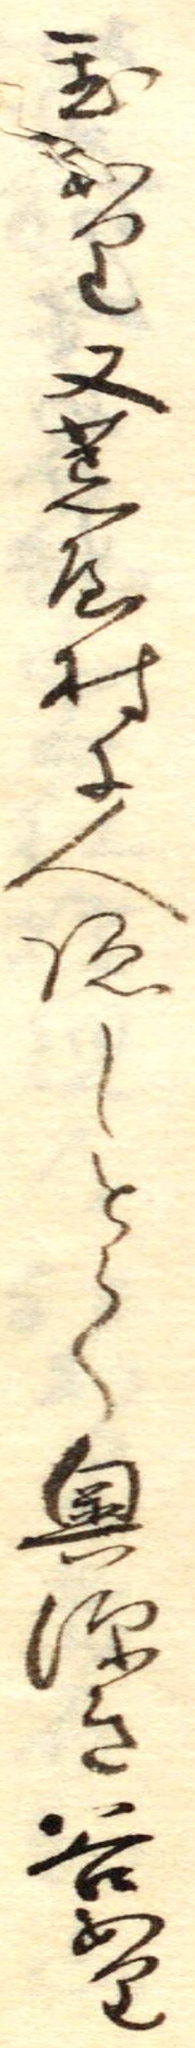置あり又荒屋村に人隠しとて奥深き谷あり
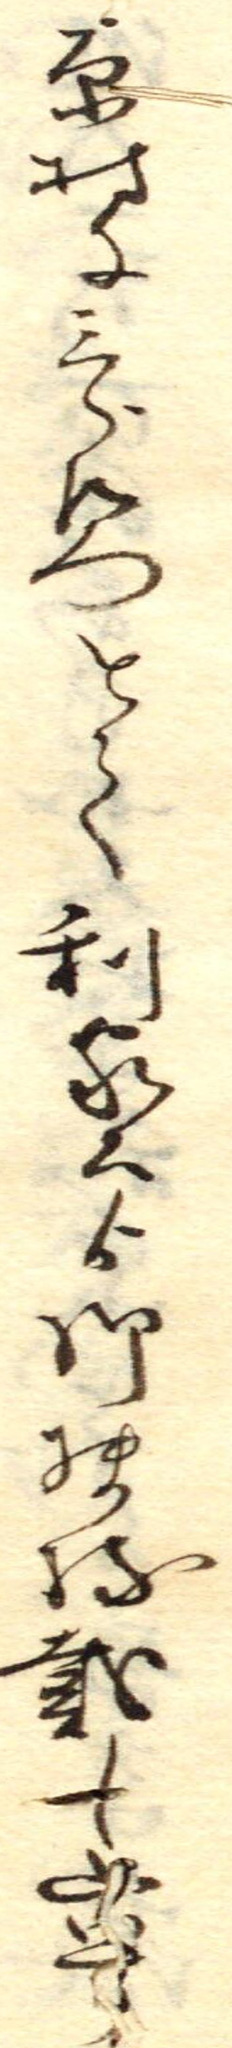原村に三郎左衛門とて利家公ゟ御扶持頂し山廻

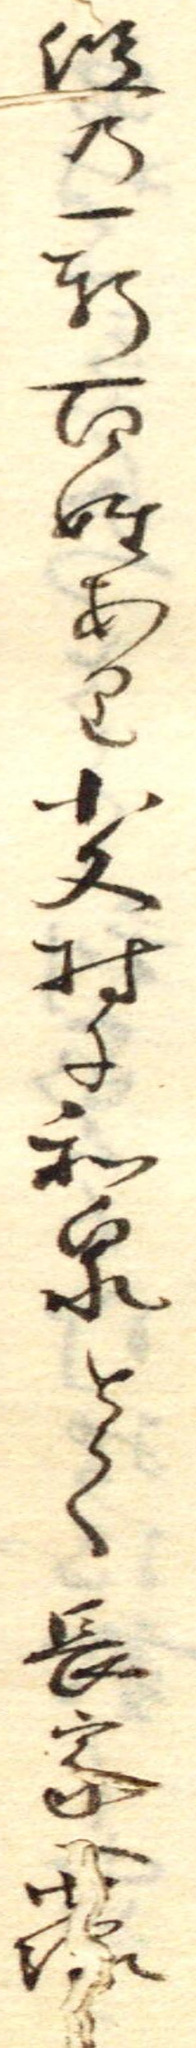役の一軒百姓あり小又村に和泉とて長家へ由縁
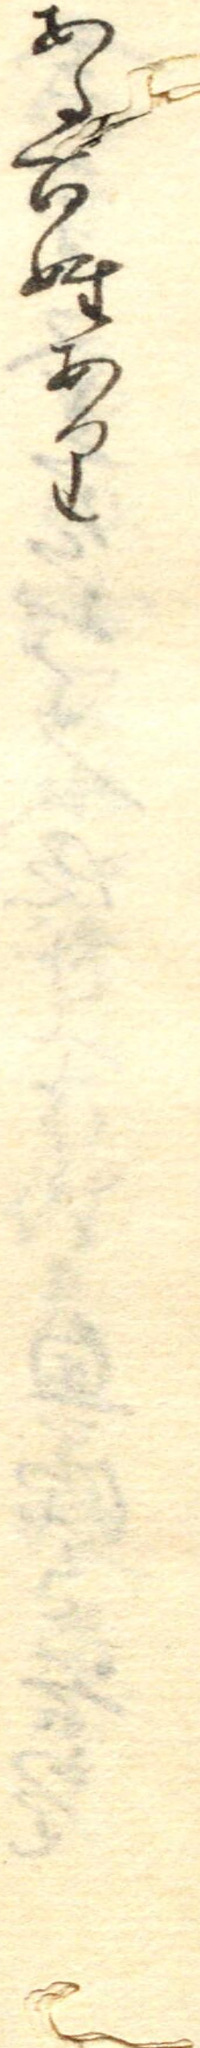ある百姓あり
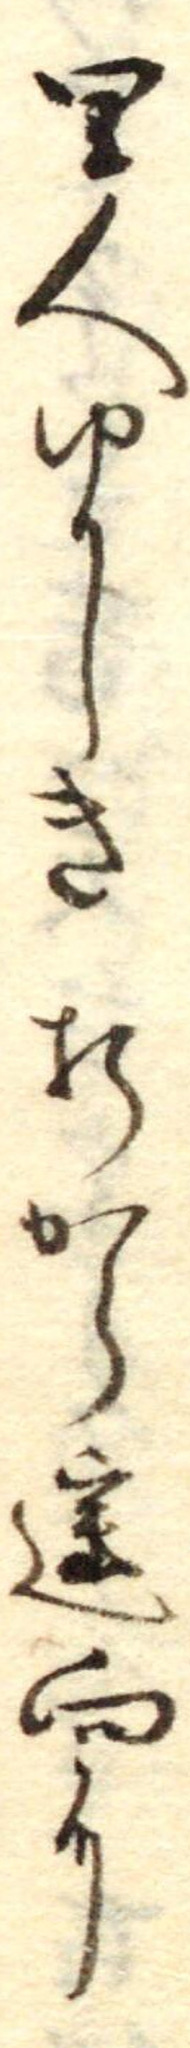里人ゆかしき折から遥向に
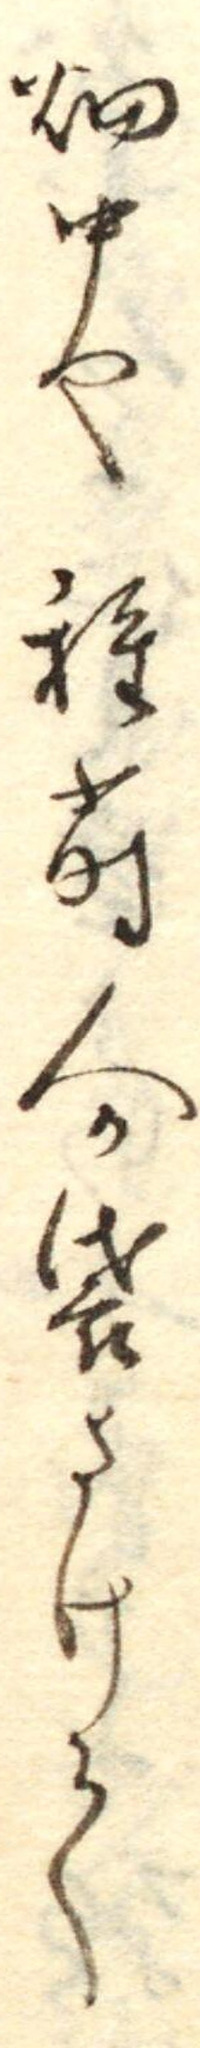畑中や種蒔人か袋さけて
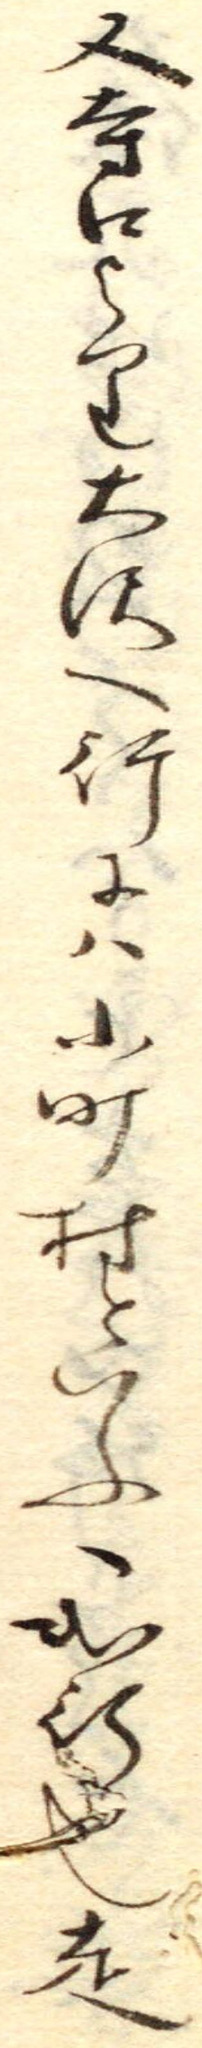又寺口より大沢へ行には小町村といふへ出行也走
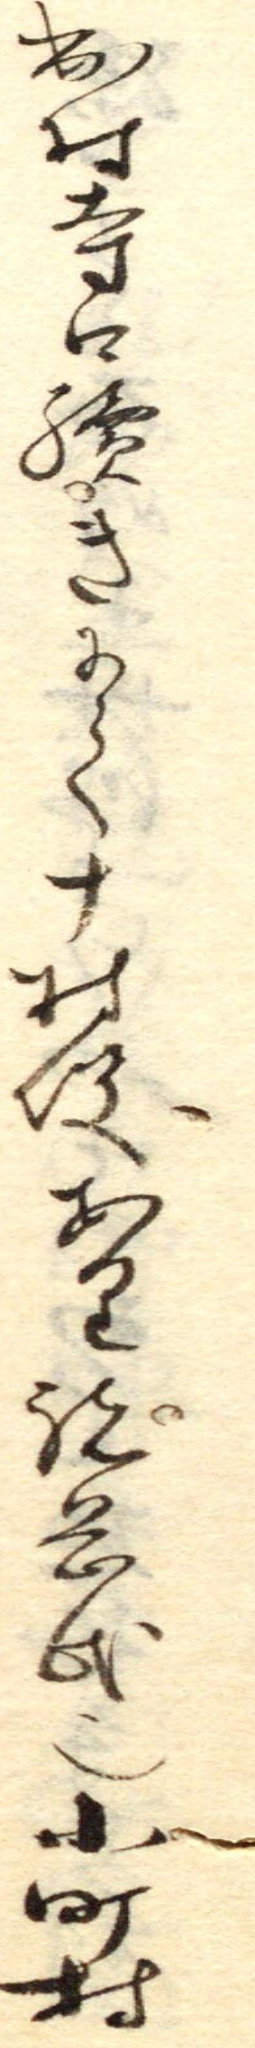出村寺口続きにて十村役あり諸岡氏也小町村
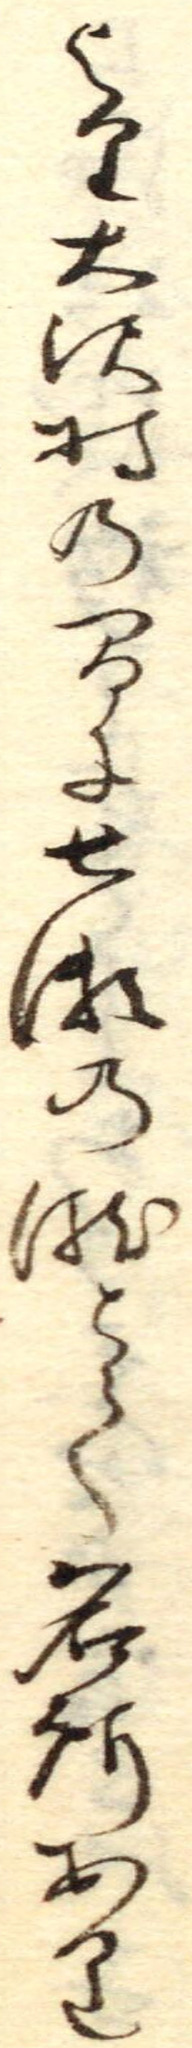より大沢村の間に七瀬の瀧とて名所あり
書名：能登名跡誌
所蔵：Ishikawa Prefectural Library
